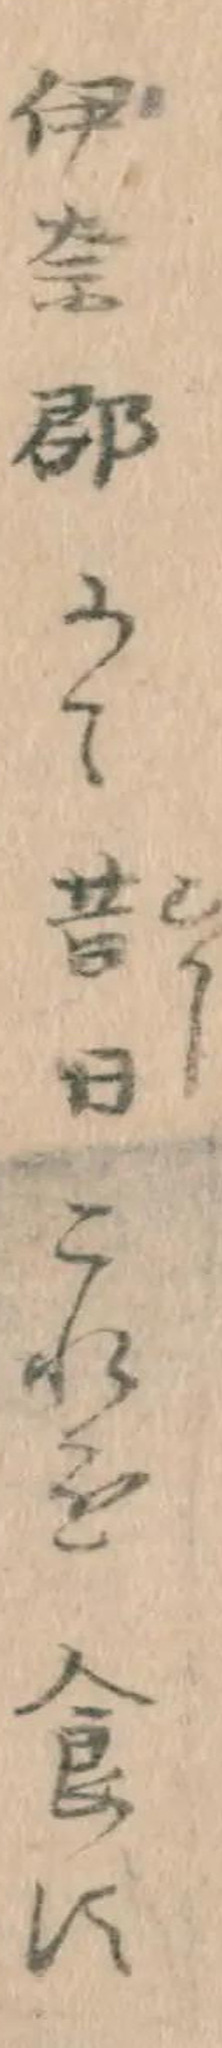伊奈郡にて昔日これを食す
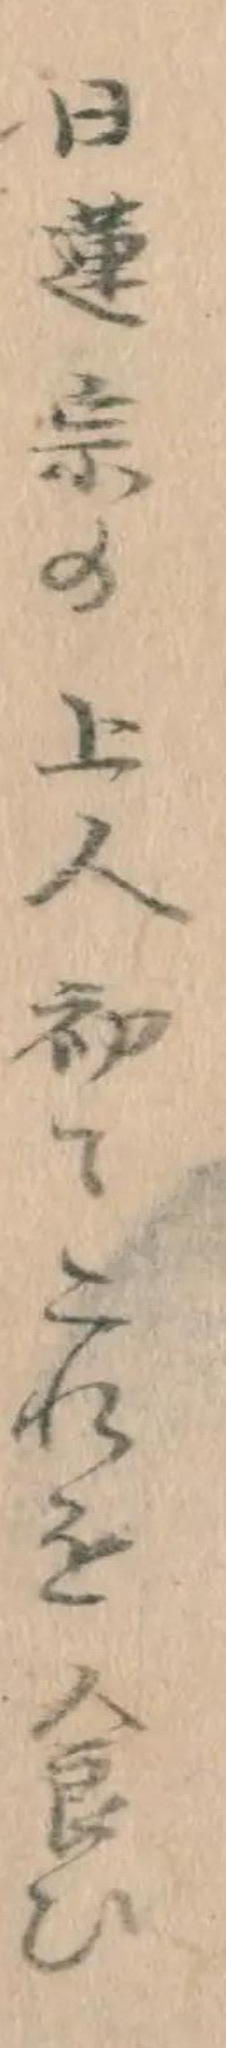日蓮宗の上人初てこれを食ひ
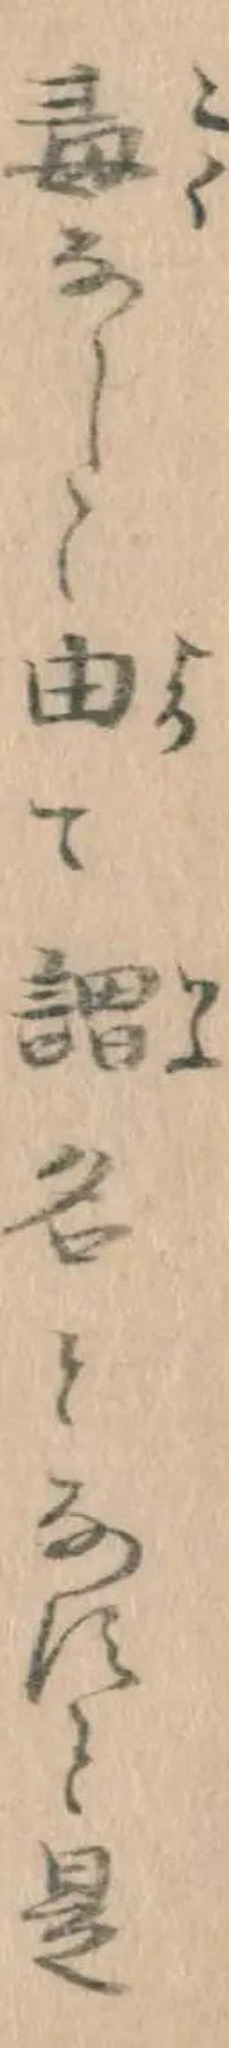毒なしと由て謂名となすと是
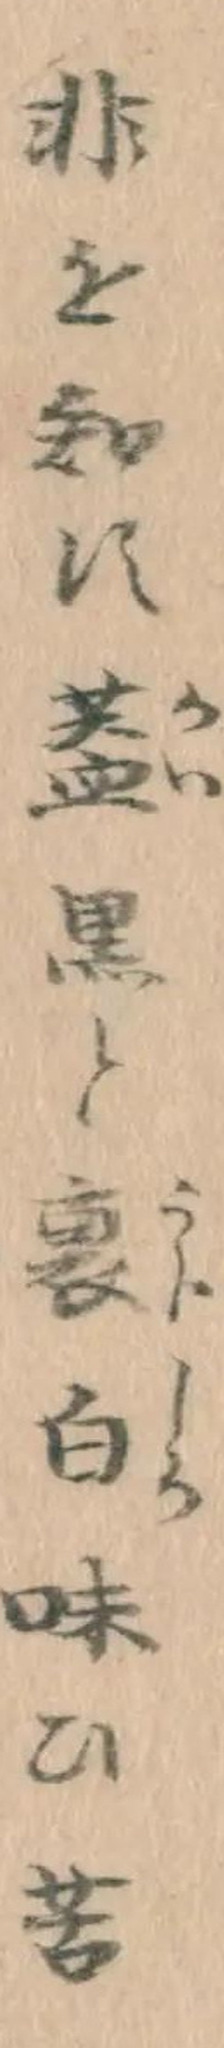非を知す蓋黒と裏白味ひ苦
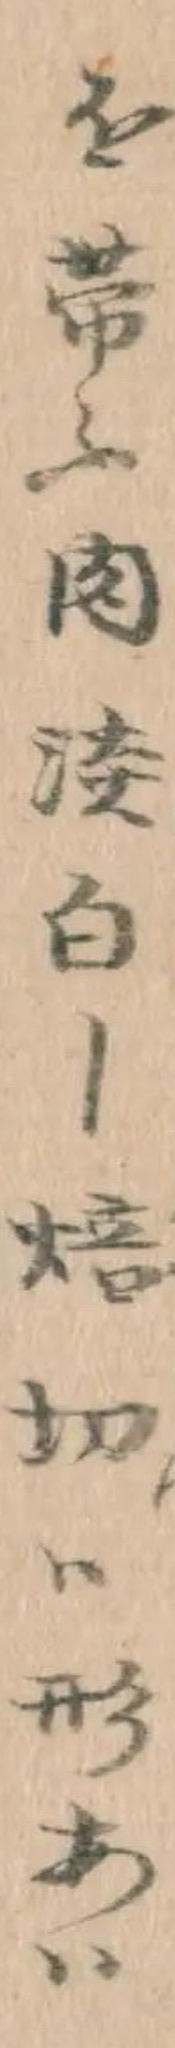を帯ふ肉淡白し焙切は形あは
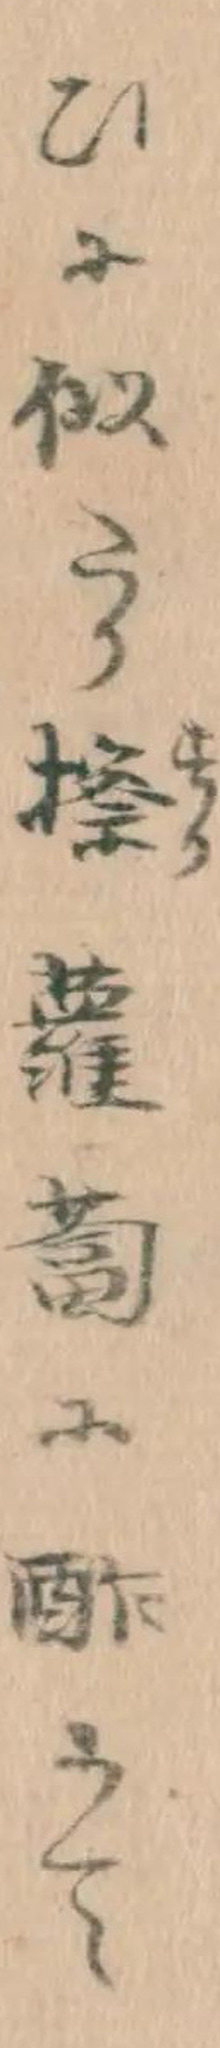ひに似たり擦蘿蔔に酢にて
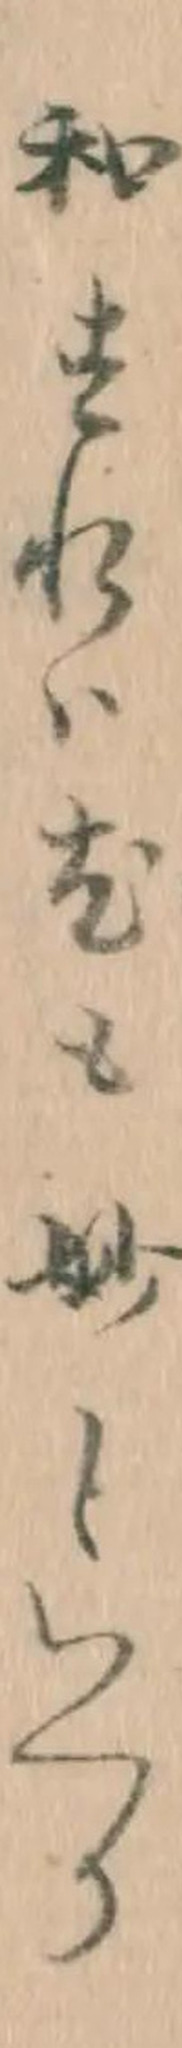和すれは尤も妙といへり
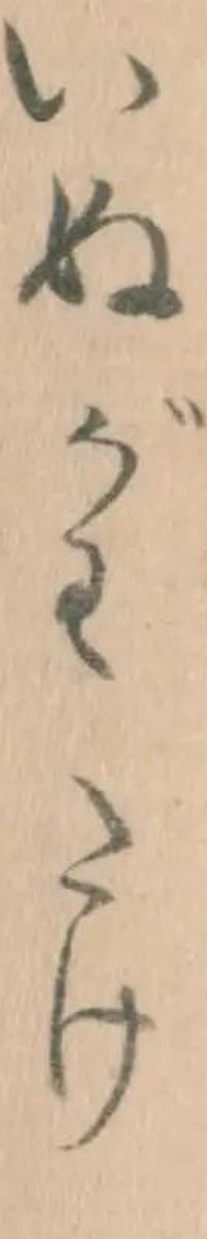いぬがわたけ
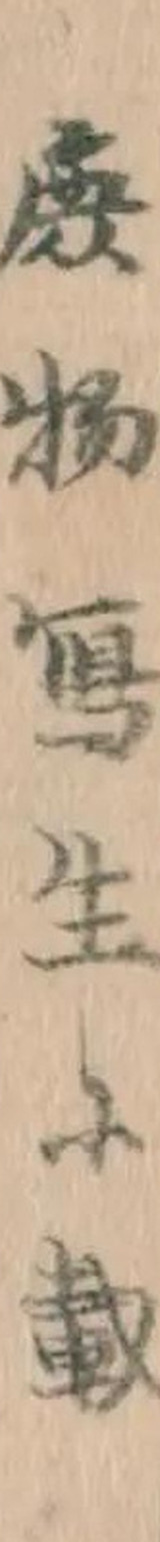庶物写生に載
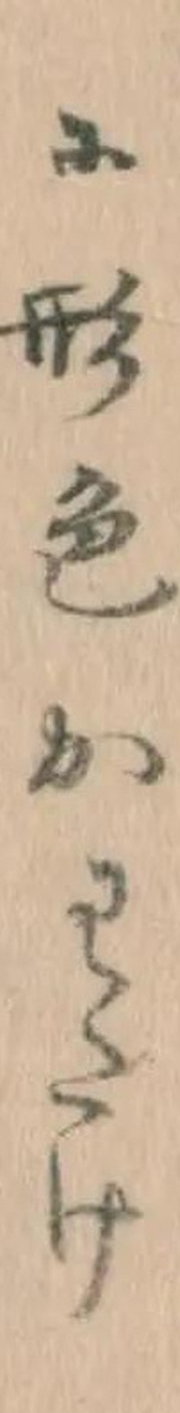に形色かわたけ
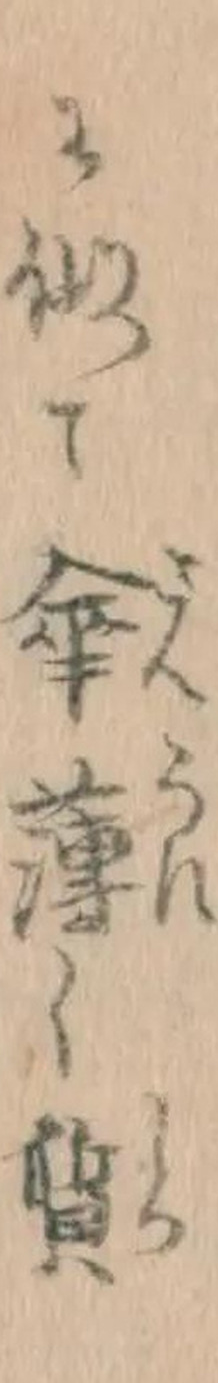に似て傘薄く質
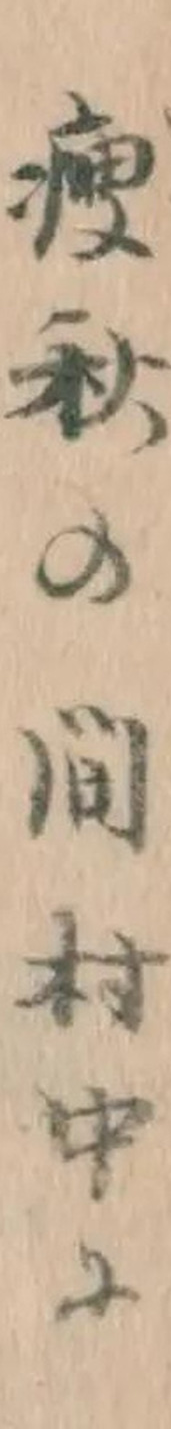痩秋の間村中に
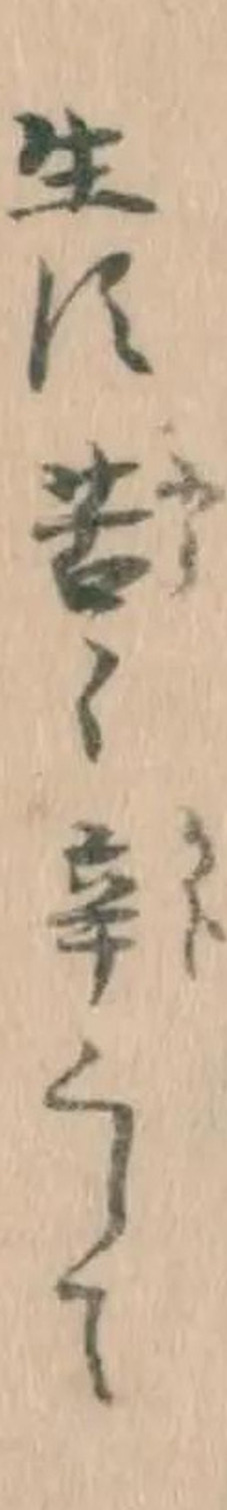生す苦く辛くして
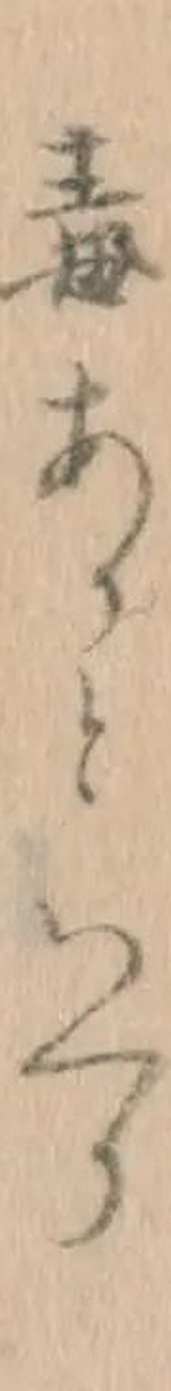毒ありといへり

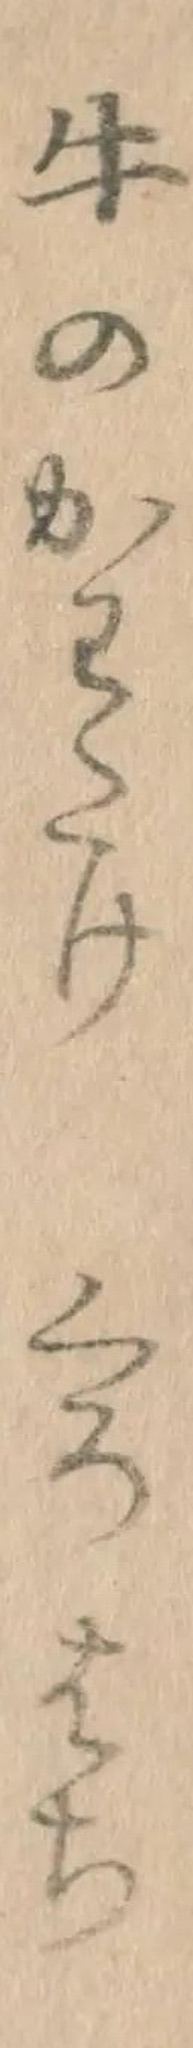牛のかわたけくろはち
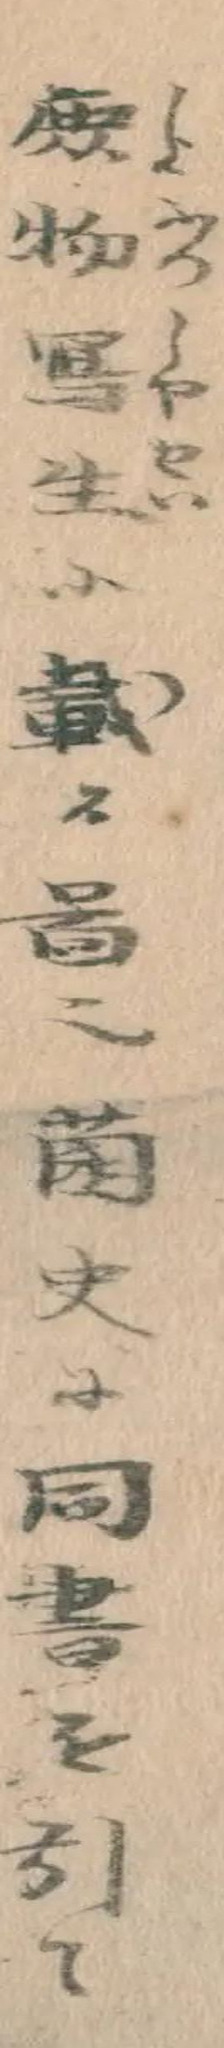庶物写生に載る図也菌史に同書を引て
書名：本草図譜. 巻55-57
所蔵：国立国会図書館 National Diet Library, JAPAN
